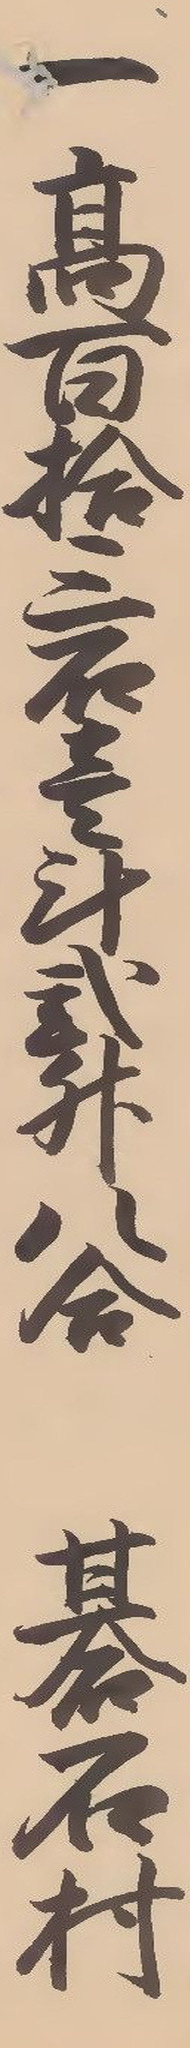一髙四拾三石壱斗弐升八合碁石村
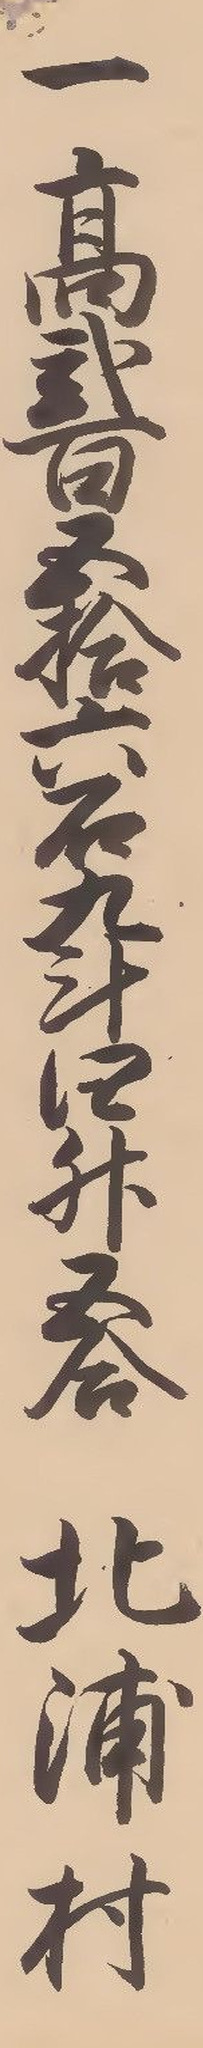一髙弐百五拾六石九斗四升五合北浦村
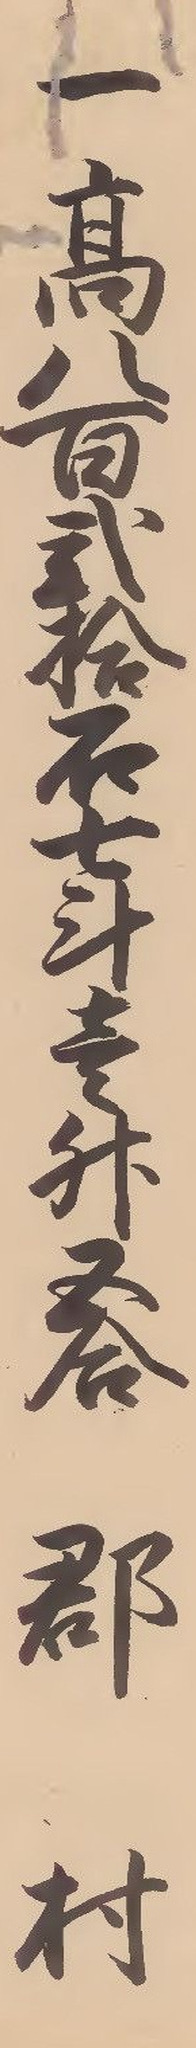一髙八百弐拾石七斗壱升五合郡村

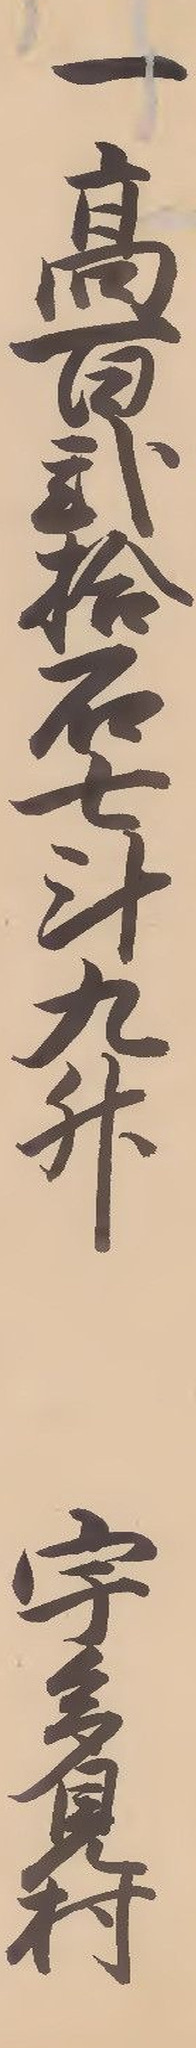一髙百弐拾石七斗九升宇多見村
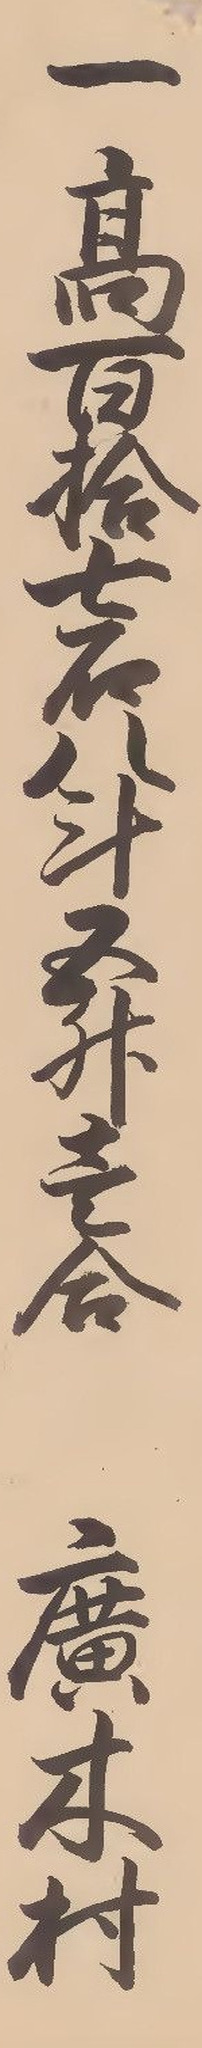一髙百拾七石八斗五升壱合廣木村
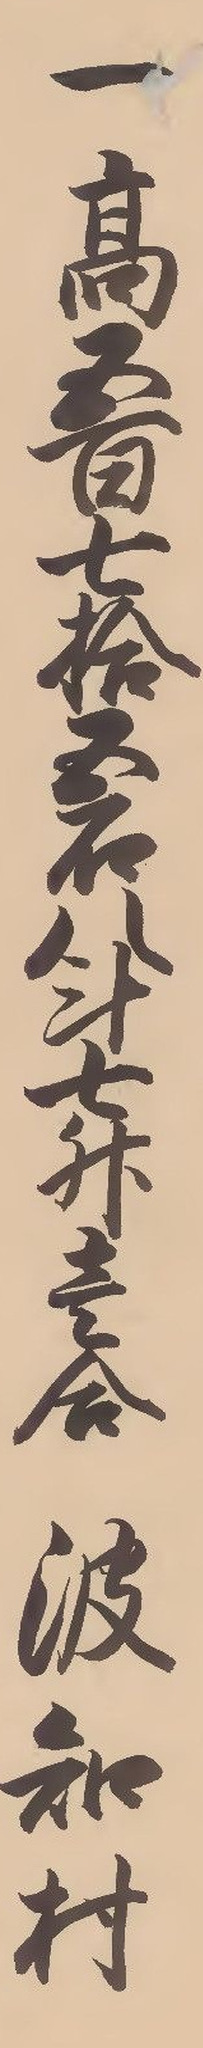一髙五百七拾五石八斗七升壱合波知村
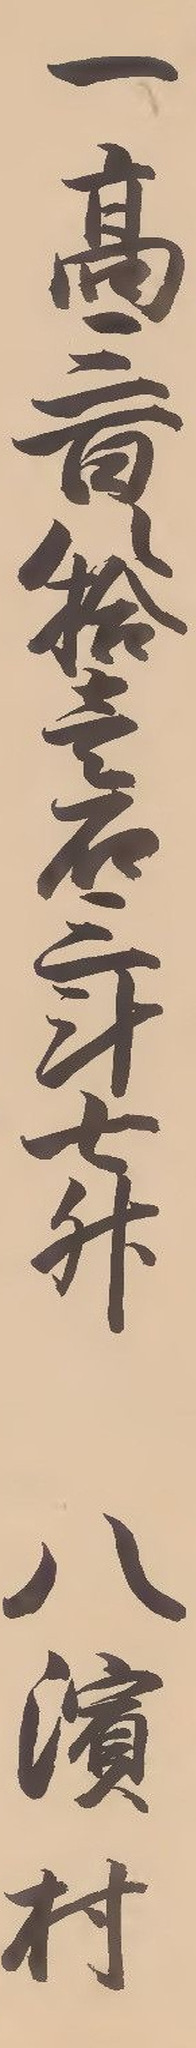一髙三百八拾壱石三斗七升八濱村
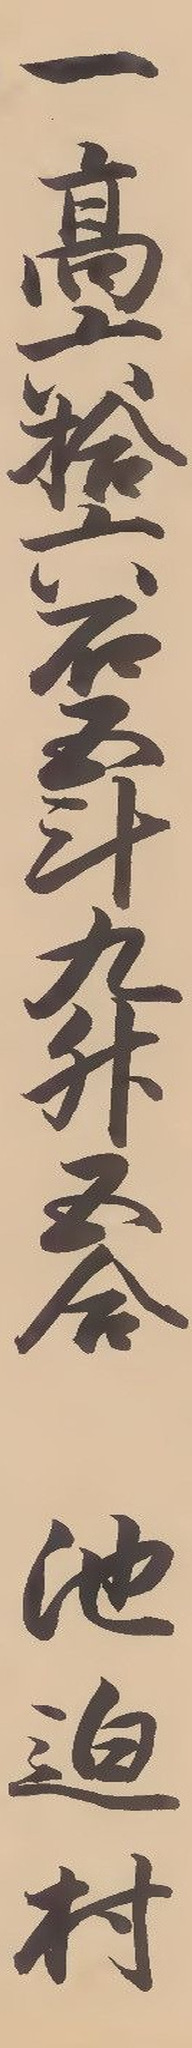一髙六拾六石五斗九升五合池迫村
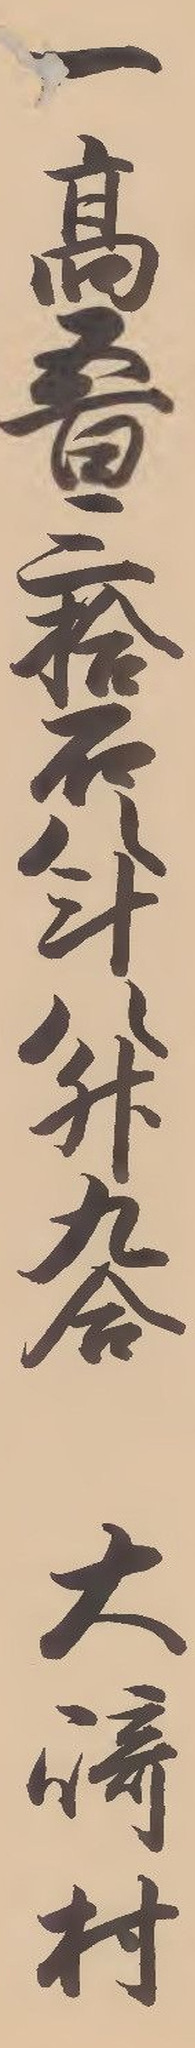一髙五百三拾石八斗八升九合大崎村
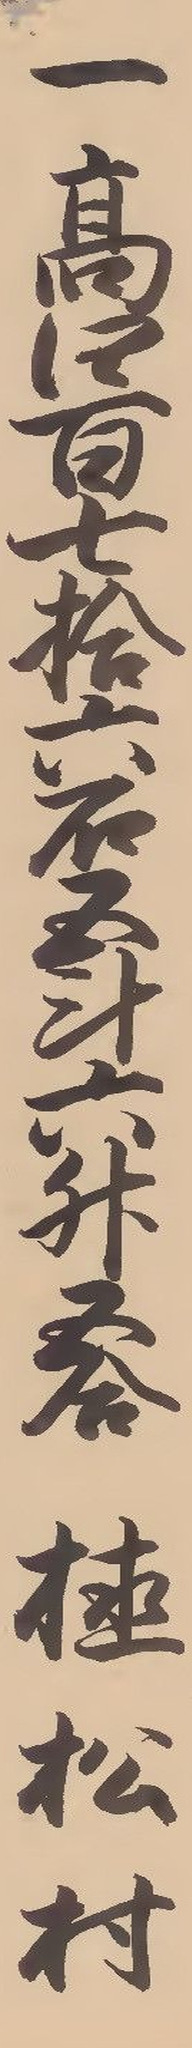一髙四百七拾六石五斗六升五合植松村
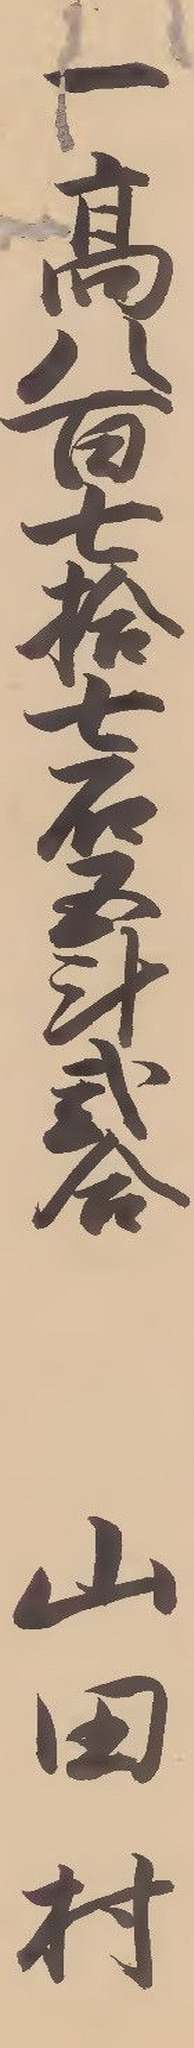一髙八百七拾七石五斗弐合山田村

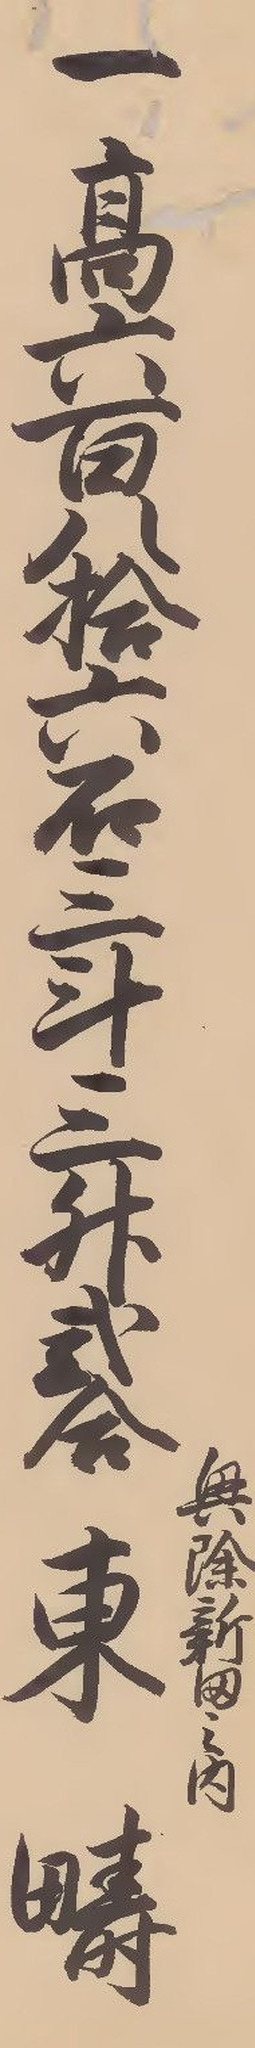一髙六百八拾六石三斗三升弐合東
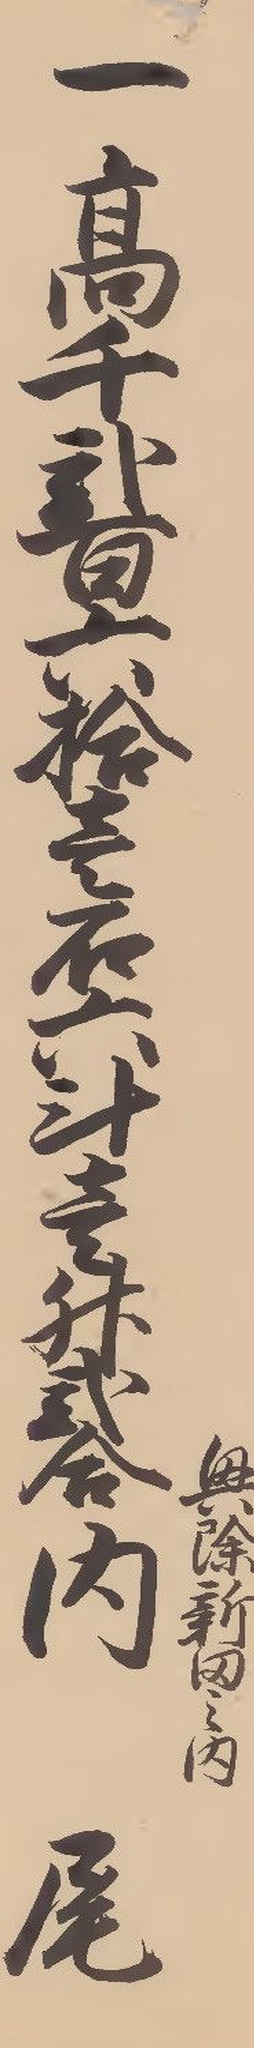一髙千弐百六拾壱石六斗壱升弐合内尾
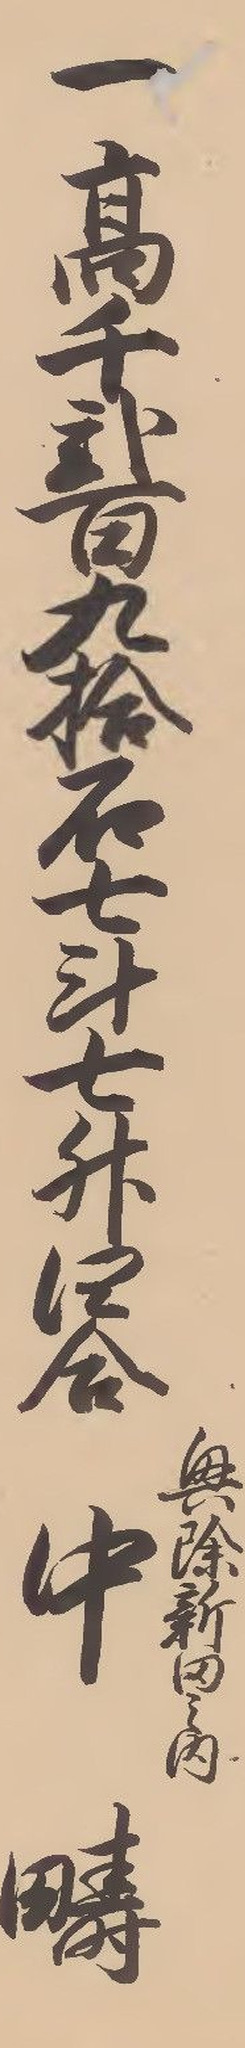一髙千弐百九拾石七斗七升四合中
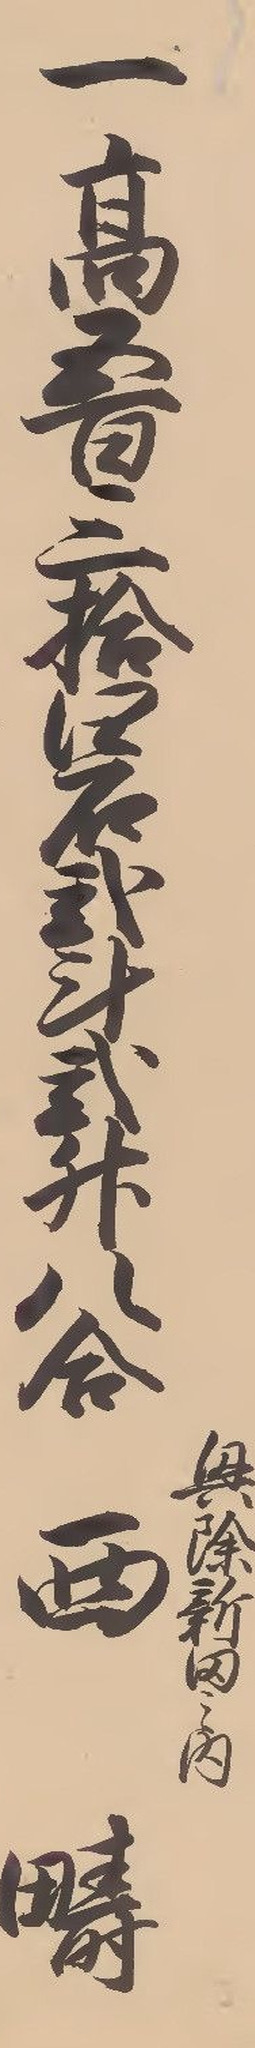一髙五百三拾四石弐斗弐升八合西
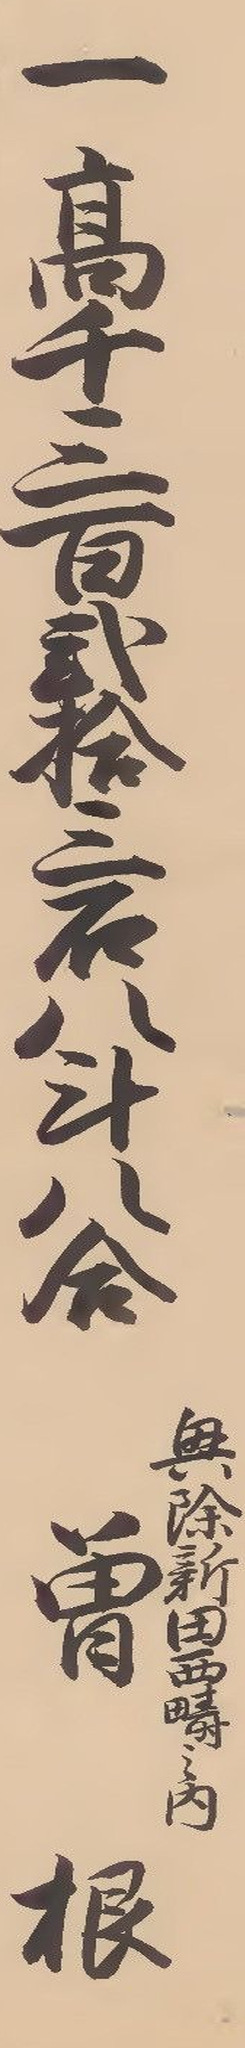一髙千三百弐拾三石八斗八合曽根
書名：備前国郷帳
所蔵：国立公文書館 National Archives of Japan
